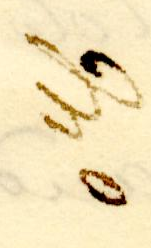In^o
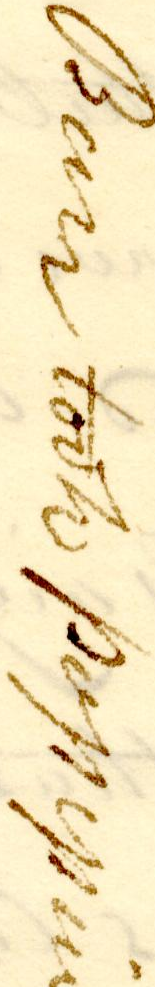Barn took Paper in
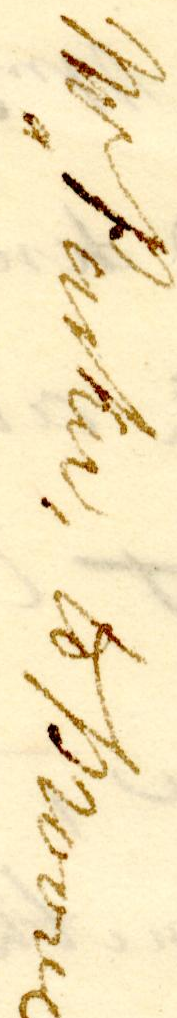M^r Parker, to proove
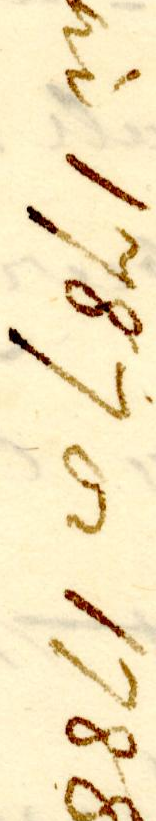in 1787 or 1788
